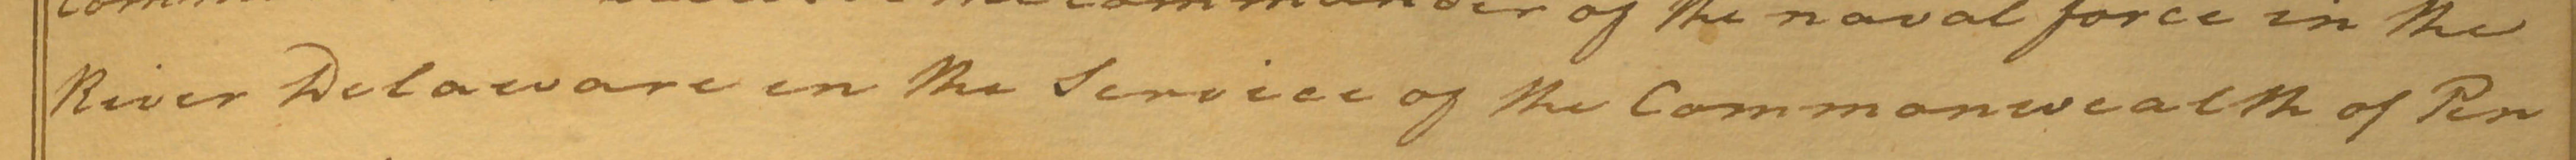River Delaware in the service of the Commonwealth of Pen
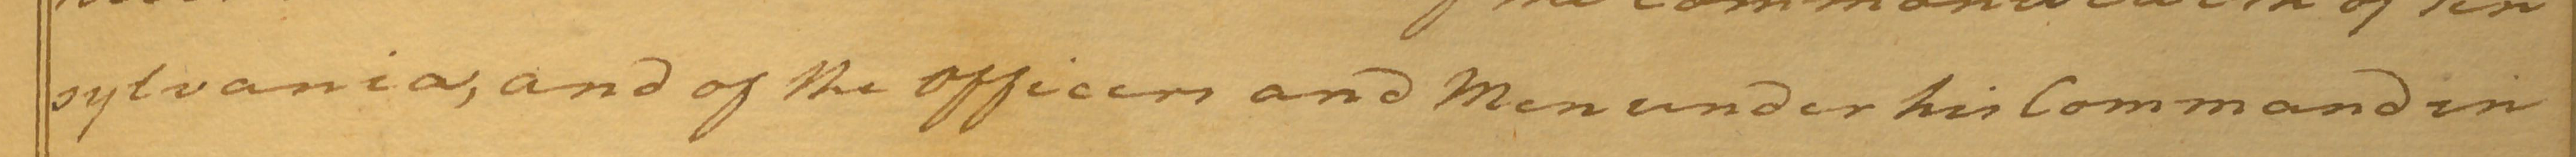sylvania, and of the Officers and Men under his command in
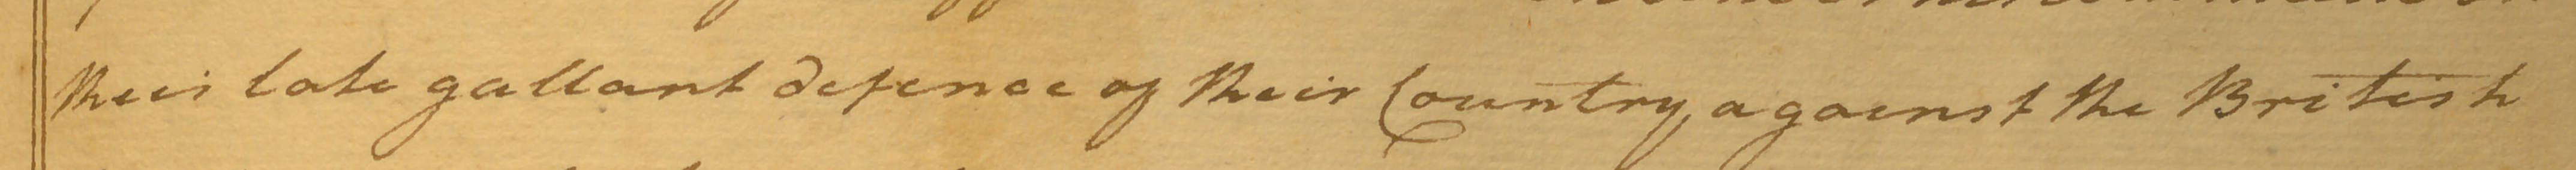their late gallant defense of their Country against the British
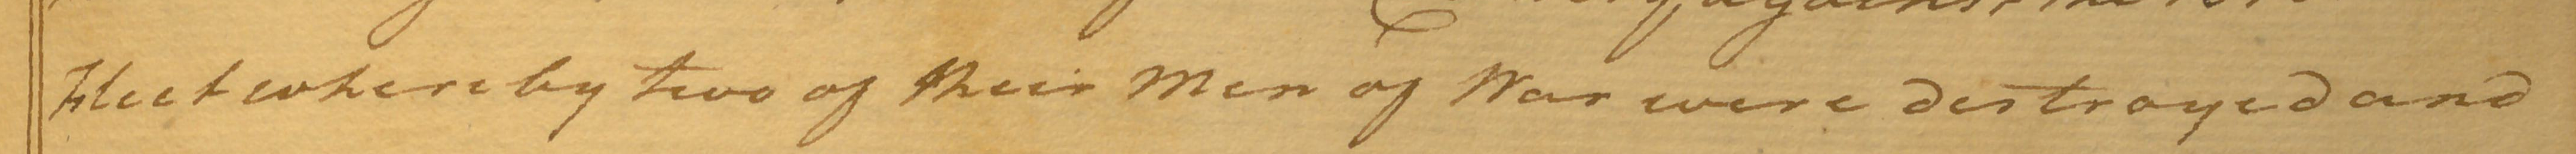Fleet whereby two of their Men of War were destroyed and
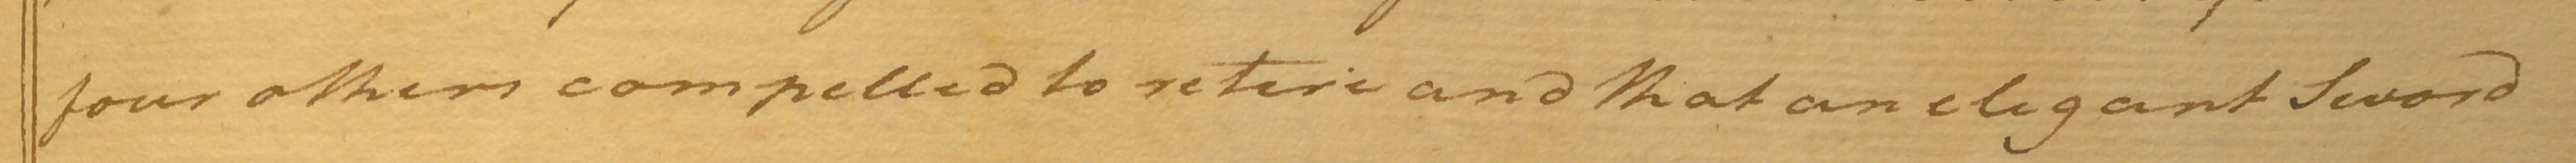four others compelled to retire and that an elegant Sword
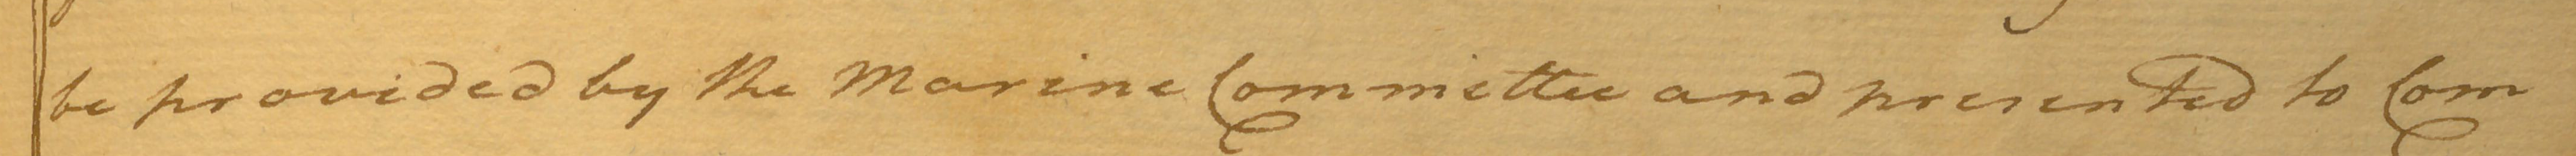be provided by the Marine Committee and presented to Com
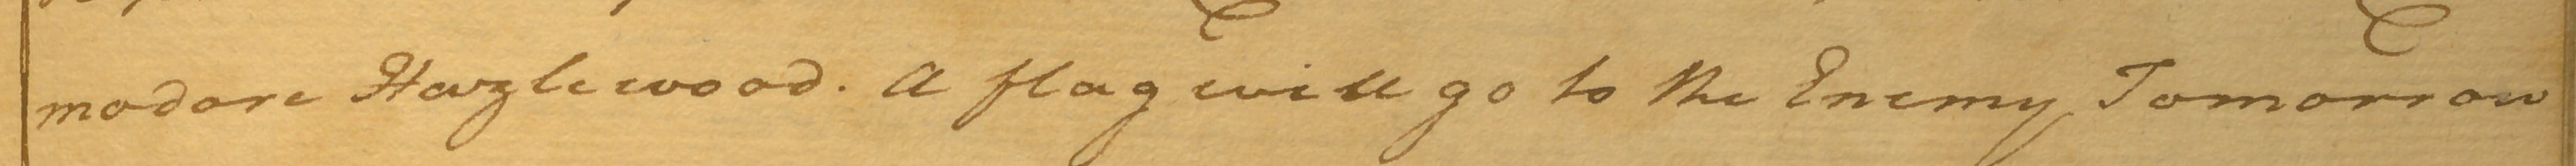modore Hazlewood. A flag will go to the Enemy Tomorrow
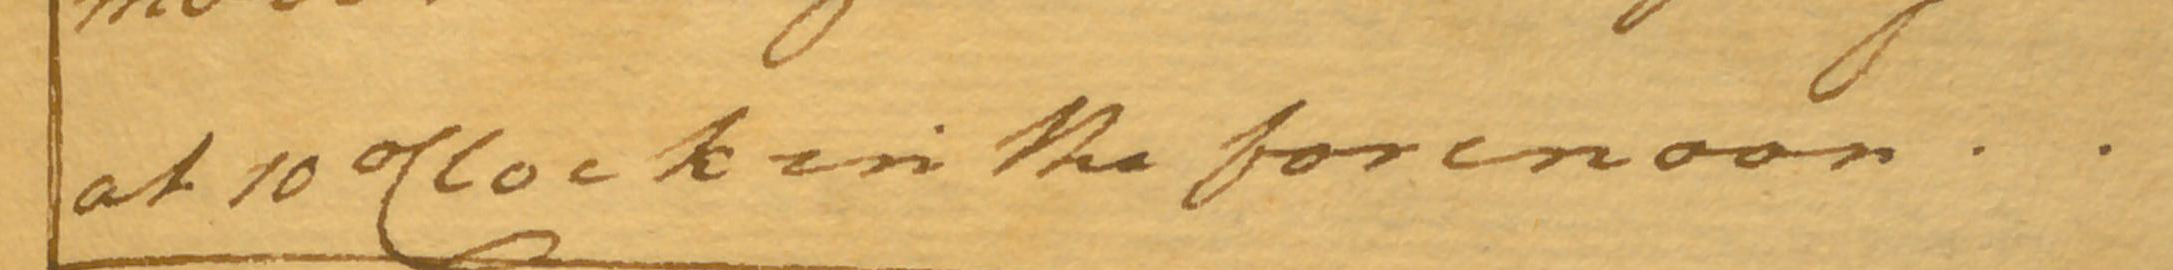at 10 ^oClock in the forenoon. .
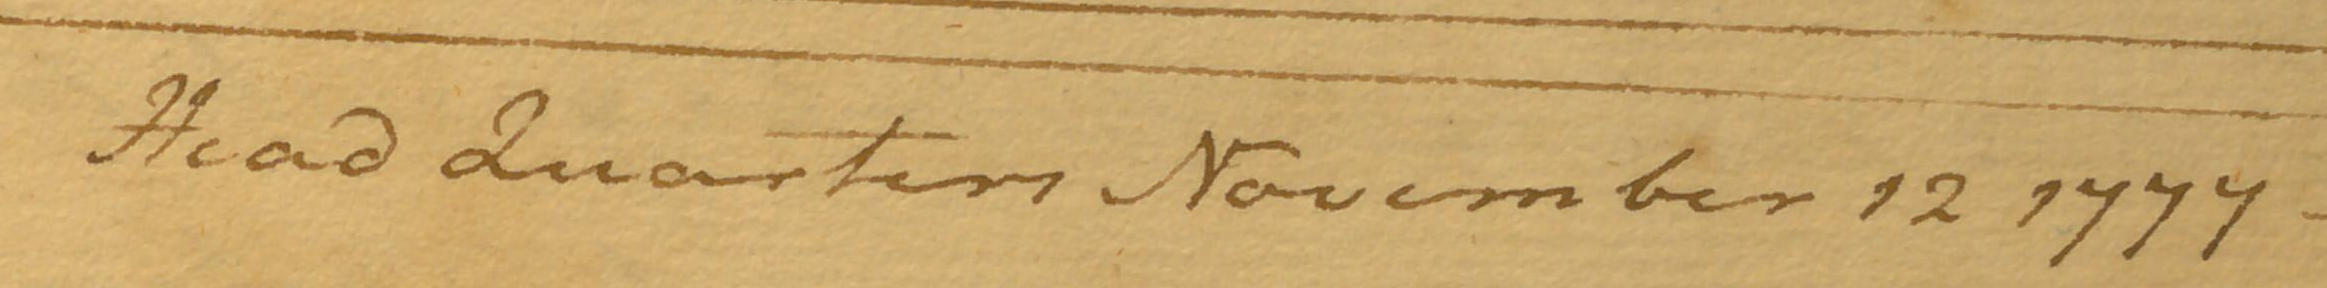Head Quarters November 12 1777
